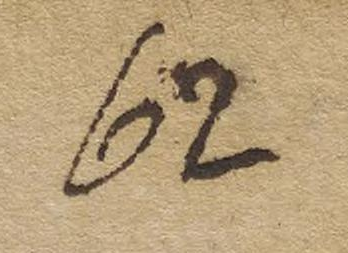62
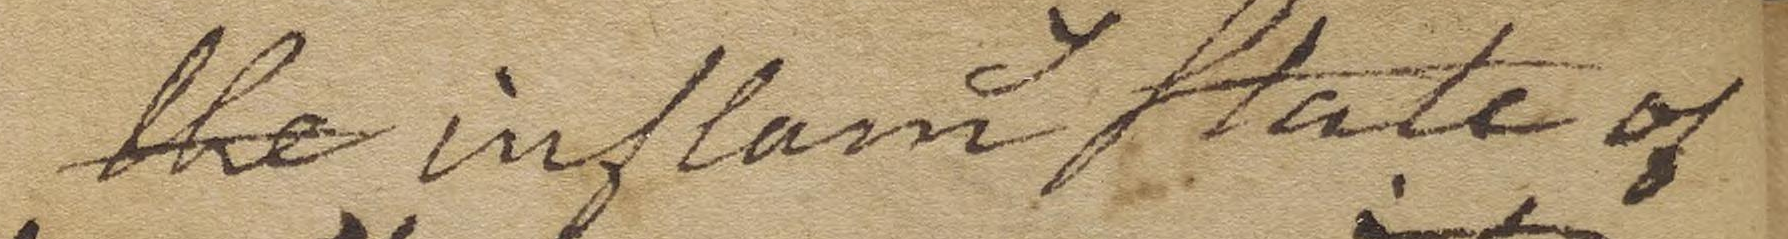[the] inflam^y state of
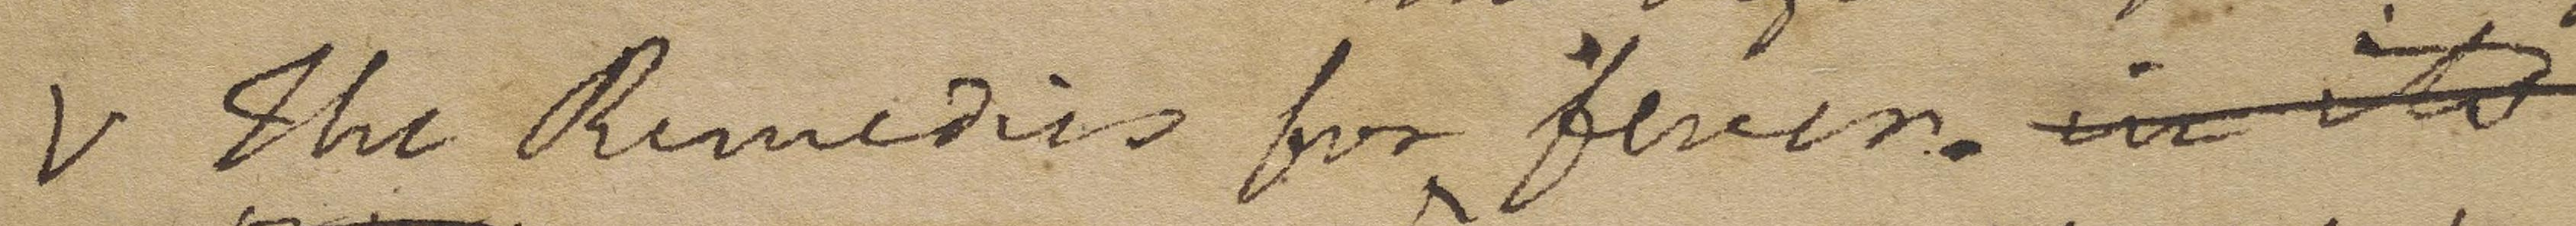V The Remedies for ^ fever. [in its]
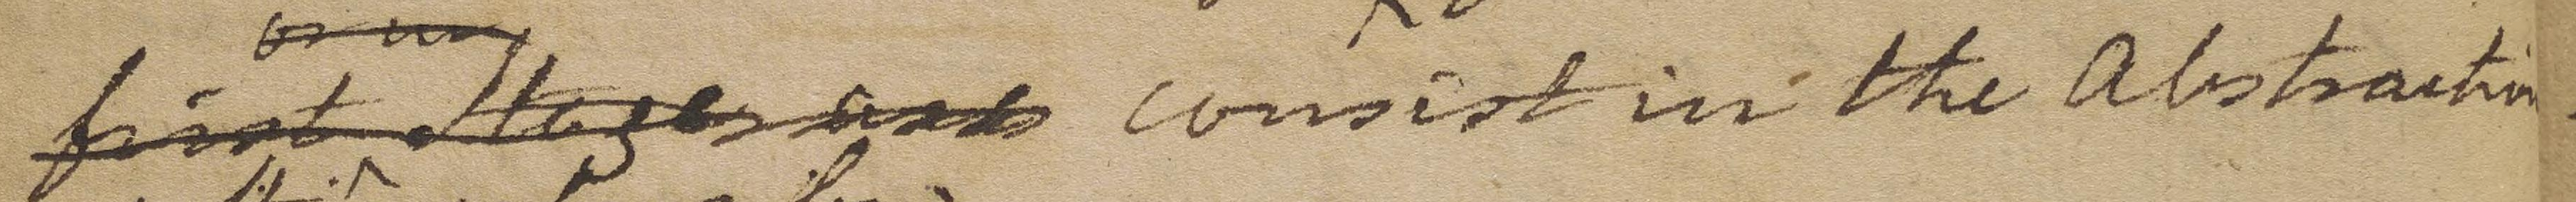[first stages and] consist in the Abstraction
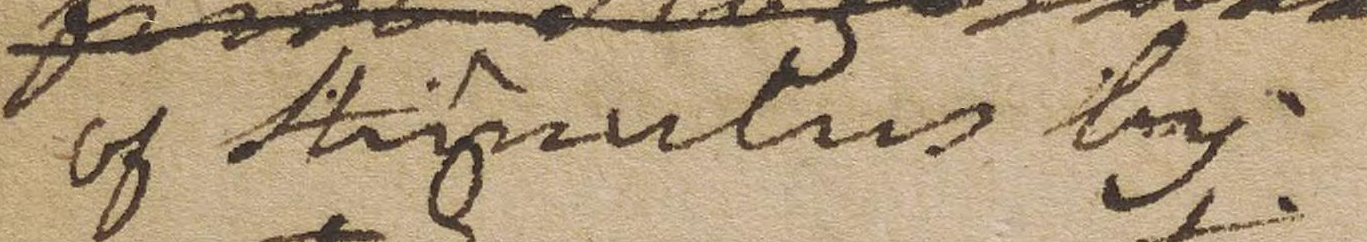of Stimulus by
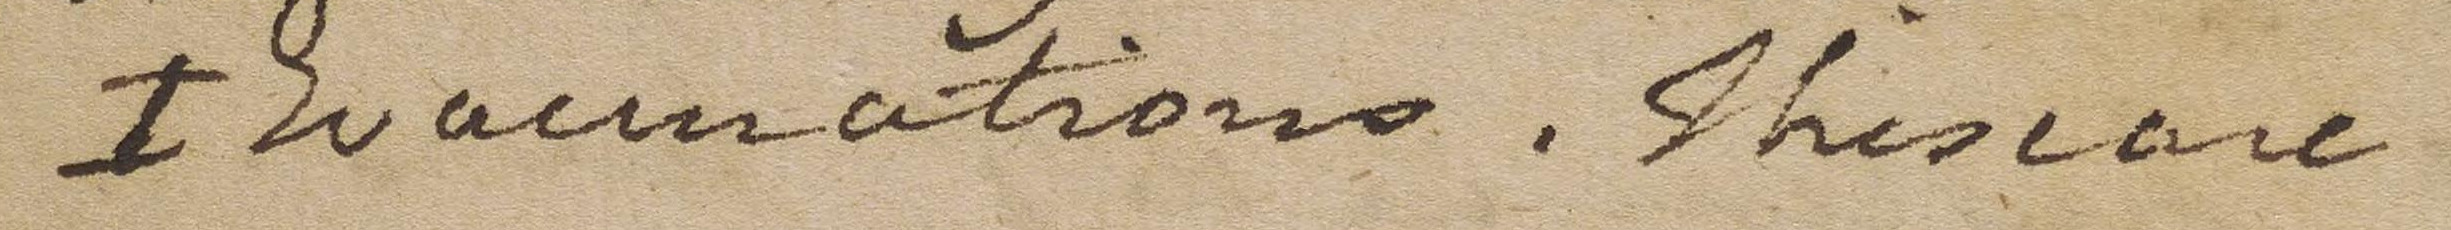I Evacuations. These are
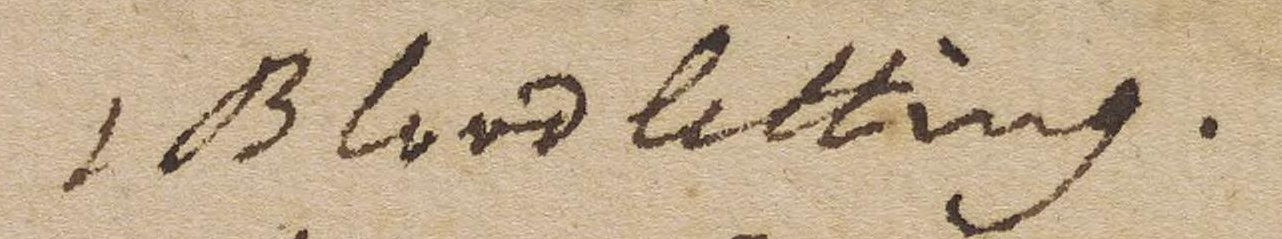1 Bloodletting
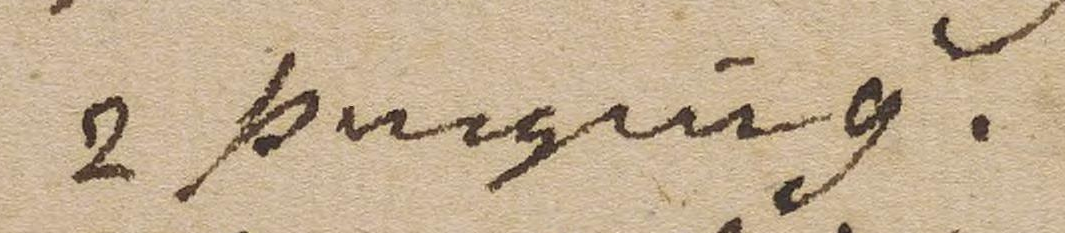2 purging.
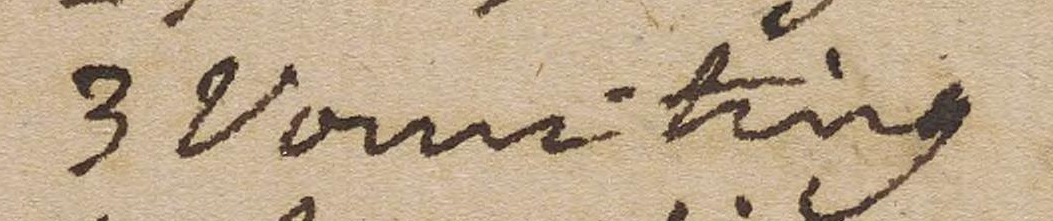3 Vomiting
